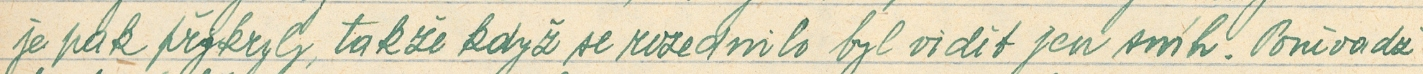je pak přikryly, takže když se rozednilo byl vidět jen sníh. Poněvadž
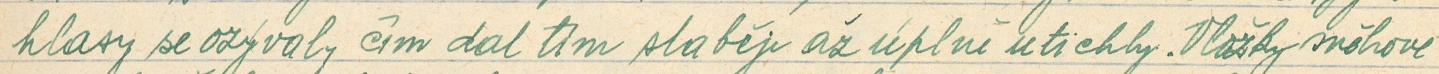hlasy se ozývaly čím dal tím slaběji až úplně utichly. Vložky sněhové
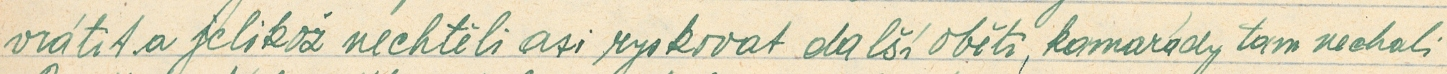vrátit a jelikož nechtěli asi ryskovat další oběti, kamarády tam nechali,
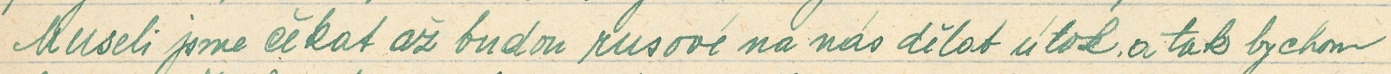Museli jsme čekat až budou rusové na nás dělat útok. a tak bychom
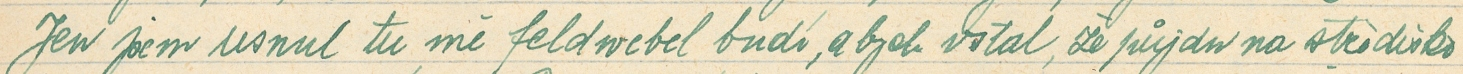Jen jsem usnul tu mě feldwebel budí, abych vstal, že půjdu na středisko
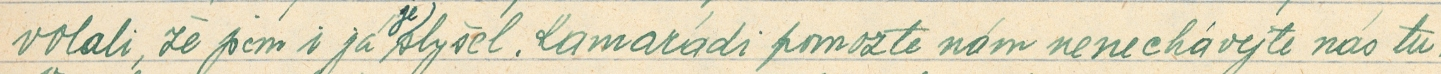volali, že jsem i já je slyšel. Kamarádi pomozte nám nenechávejte nás tu.
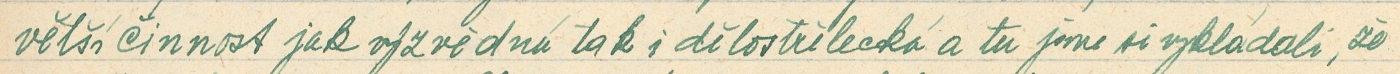větší činnost jak výzvědná tak i dělostřelecká a tu jsme si vykládali, že
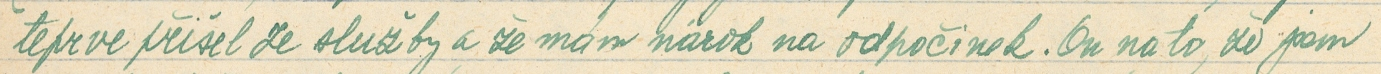teprve přišel ze služby a že mám nárok na odpočinek. On na to, že jsem
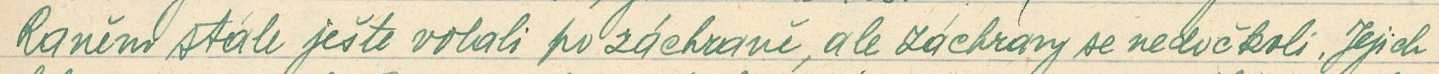Raněni stále ješte volali po záchraně, ale záchrany se nedočkali. Jejich
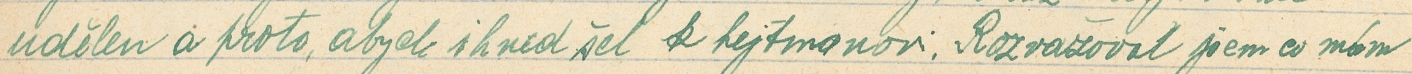udělen a proto, abych ihned šel k hejtmanovi. Rozvažoval jsem co mám
